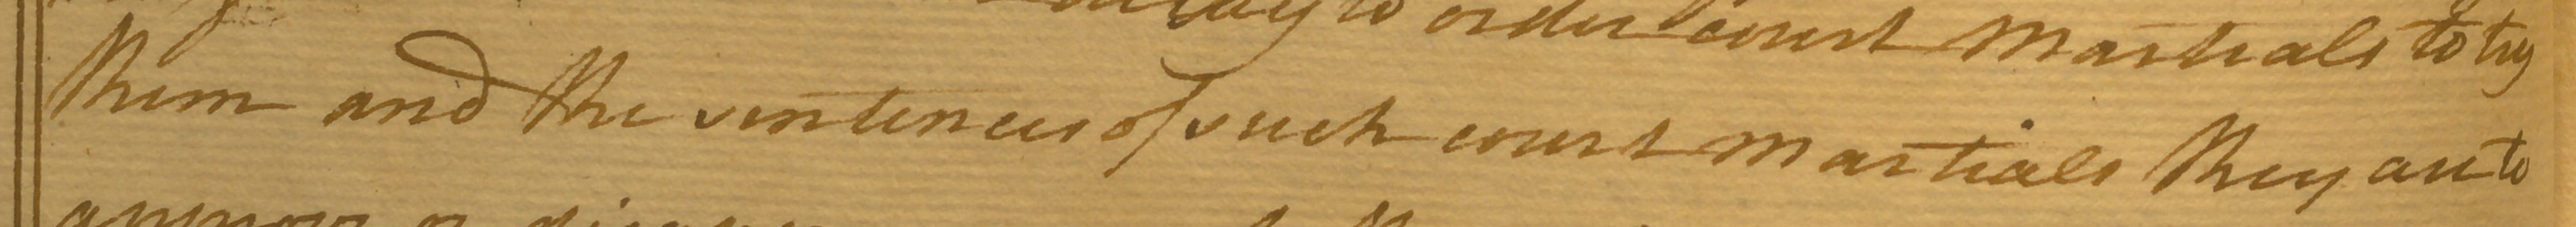them and the sentences of such court martials they are to
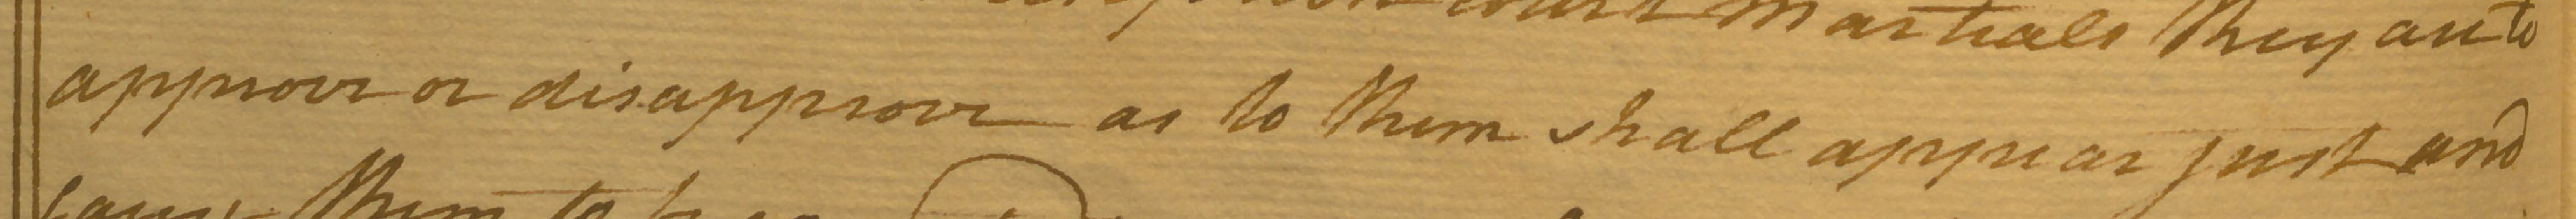approve or disapprove as to them shall appear just and
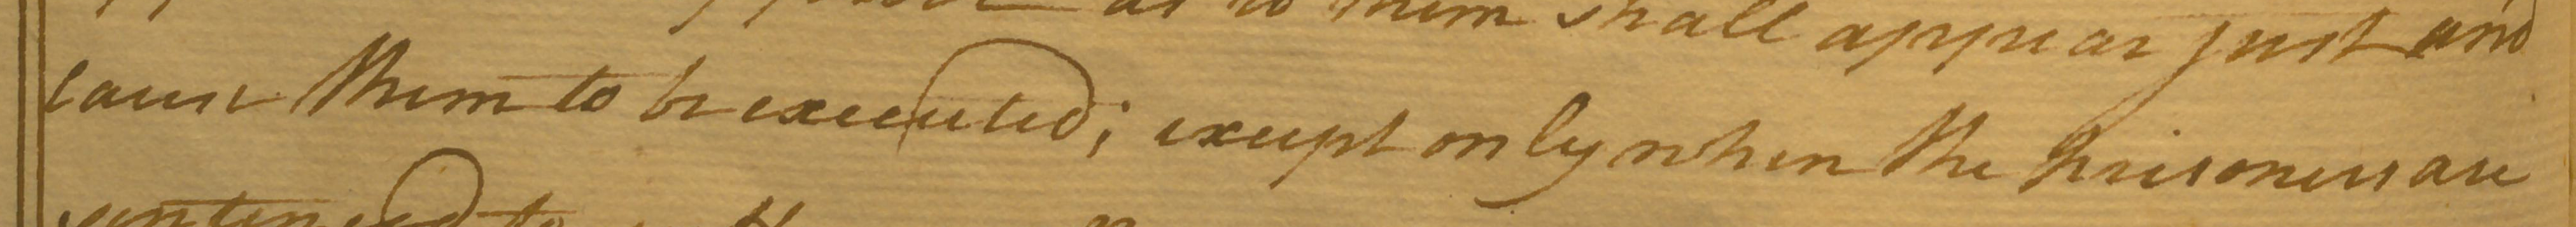cause them to be executed; except only when the prisoners are
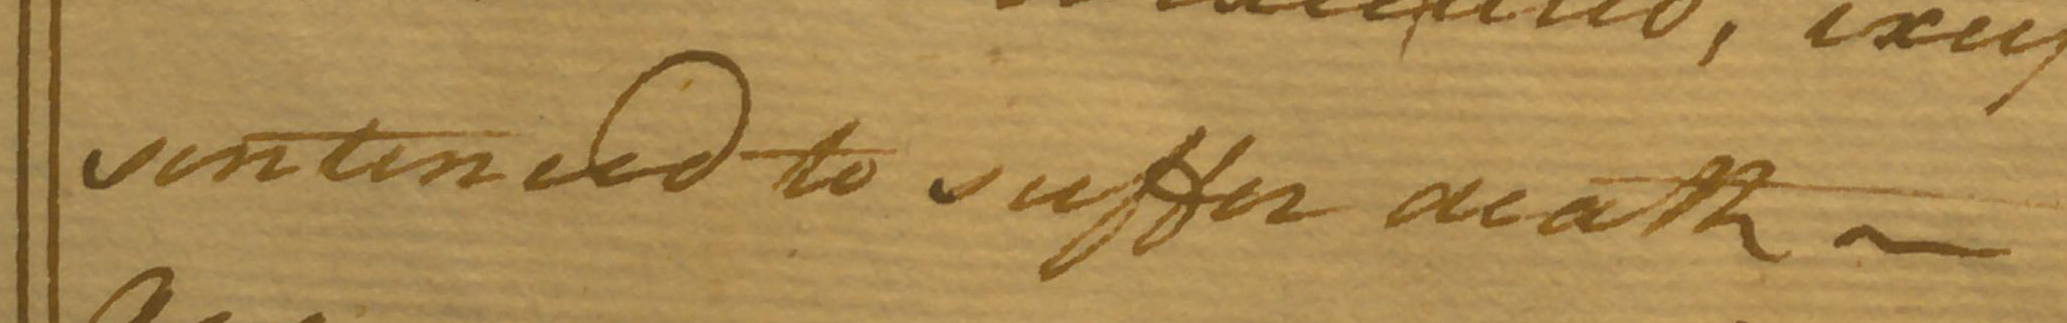sentenced to suffer death-
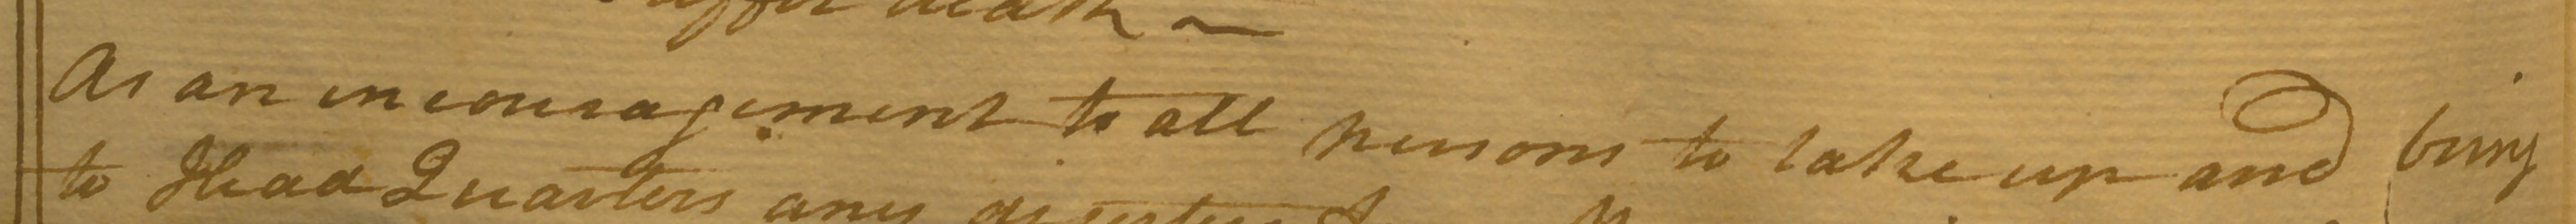As an encouragement to all persons to take up and bring
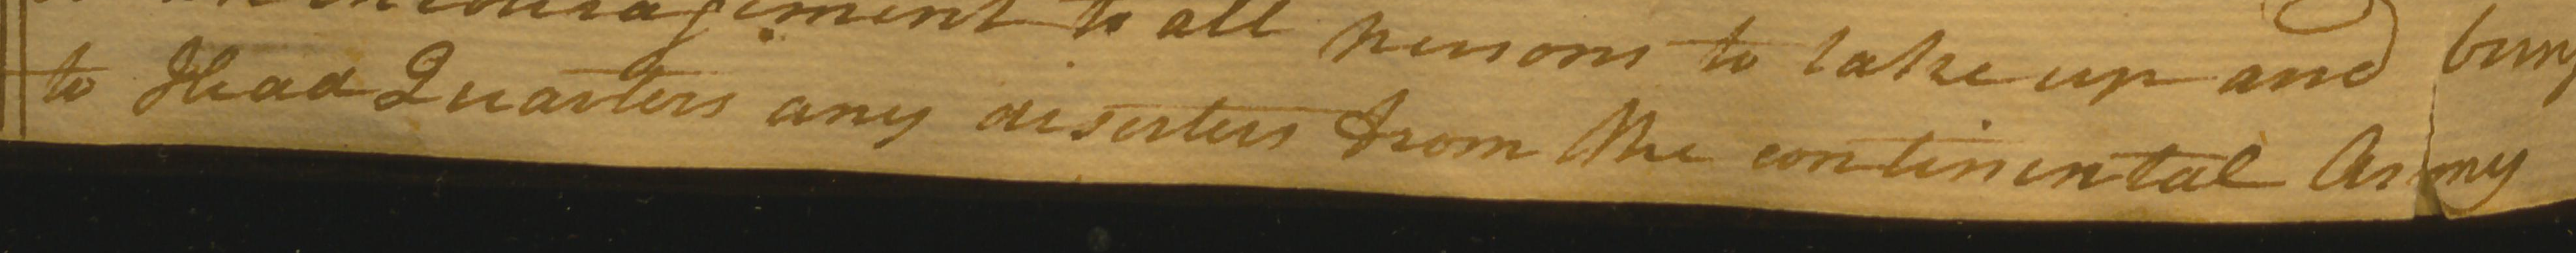to Head Quarters and diserters from the continental Army
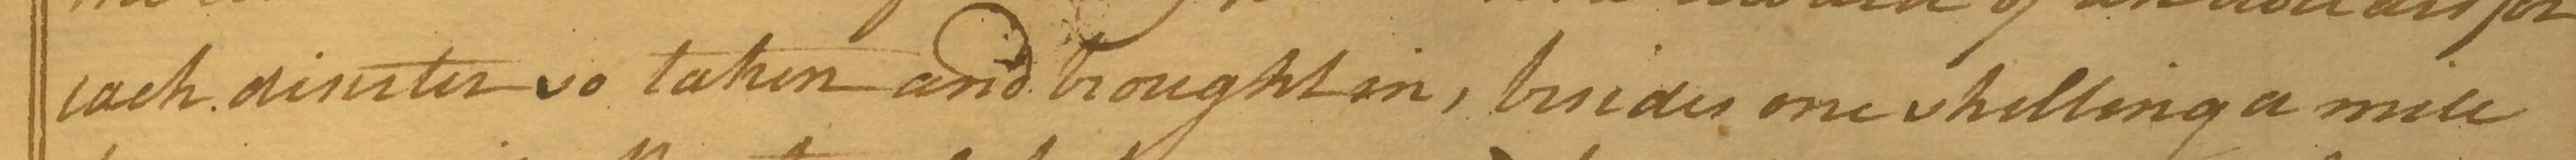each diserter so taken and brought in, besides one shilling a mile
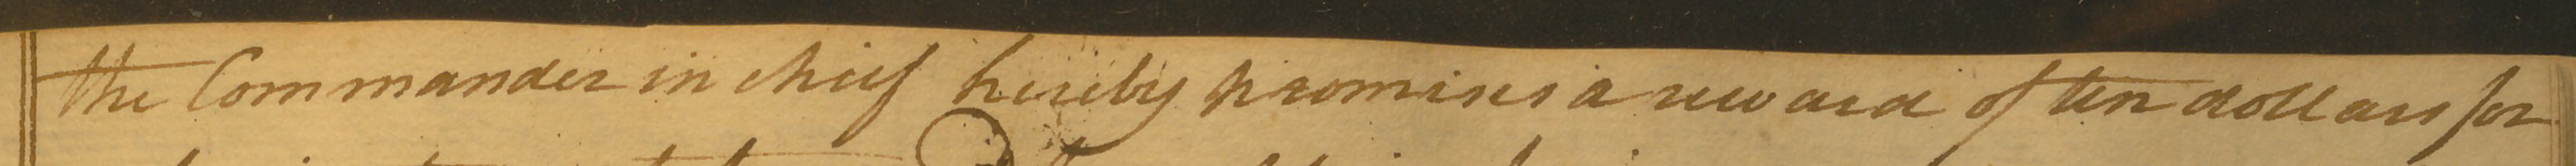the Commander in chief hereby promises a reward of ten dollars for
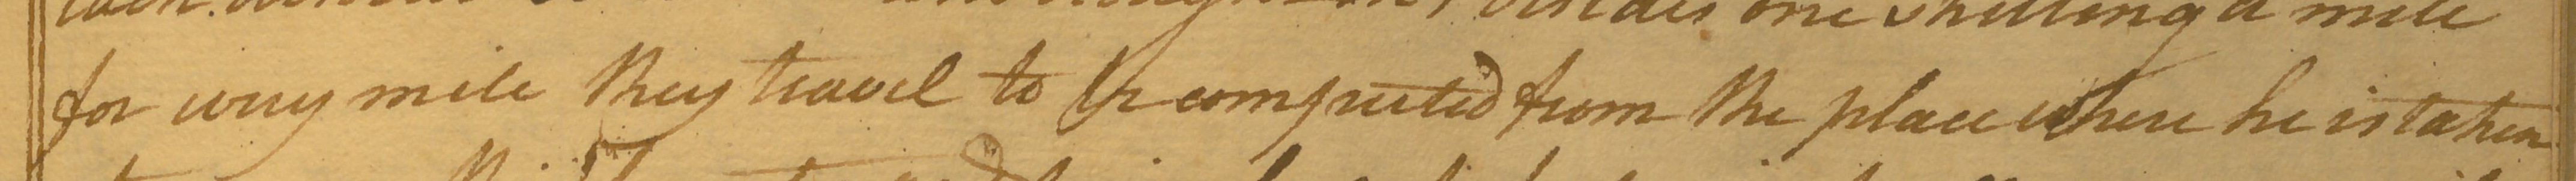for every mile they travel to be computed from the place where he is taken
